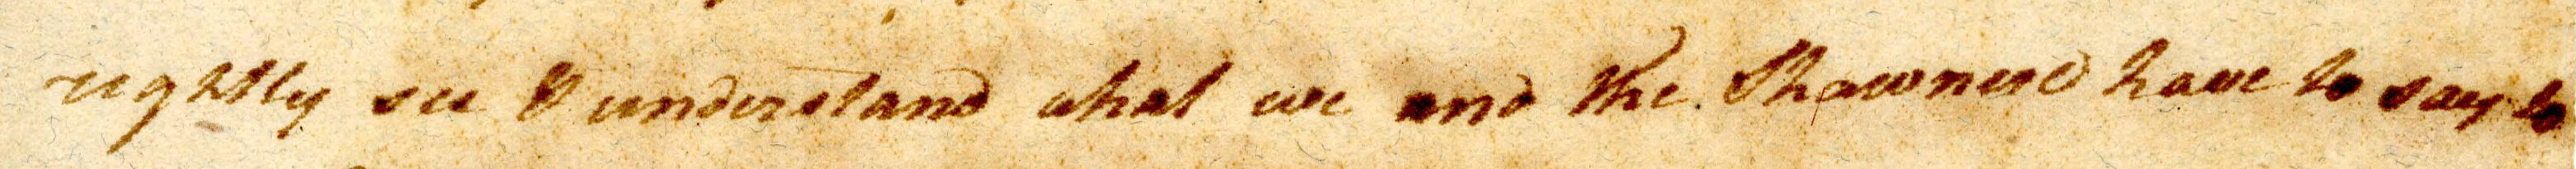rightly see & understand what we and the Shawnese have to say to
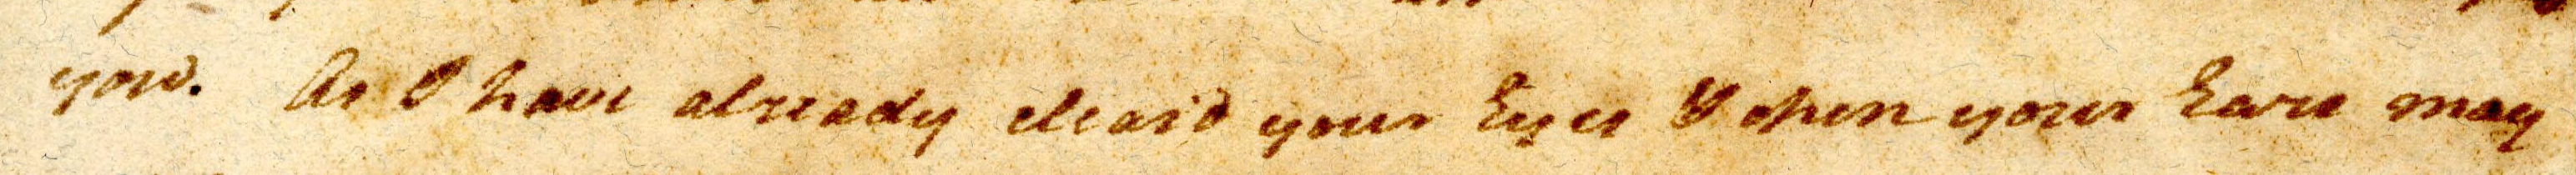you. As I have already clear'd your Eyes & open your Ears may
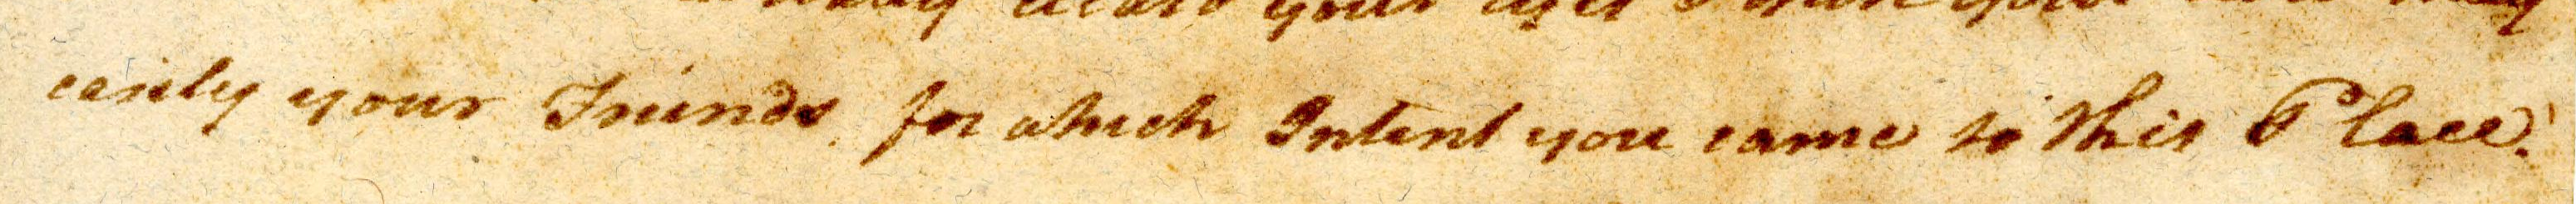easily your Friends, for which Intent you came to this Place.
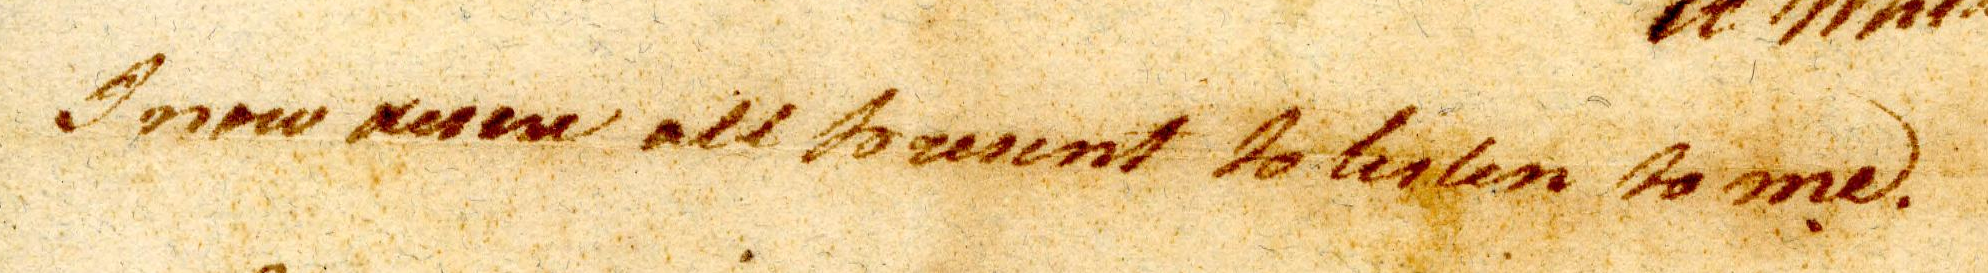I now desire all present to listen to me.
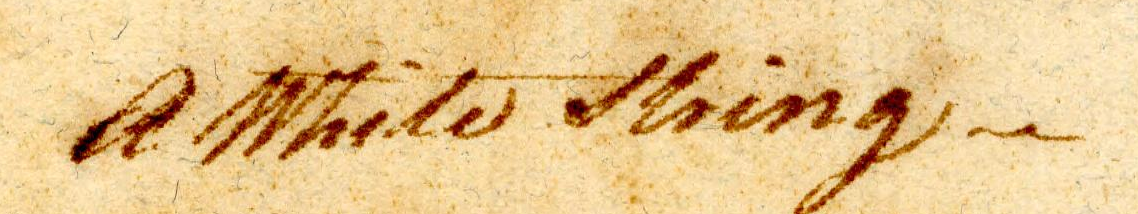A White String-
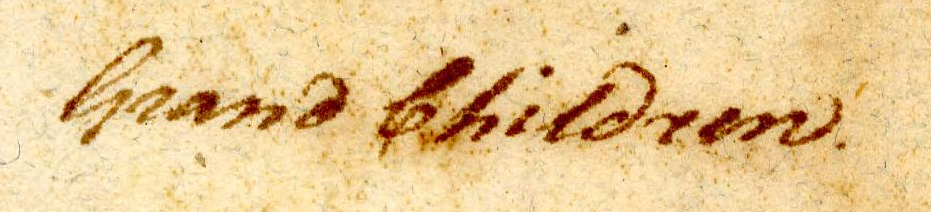Grand Children.
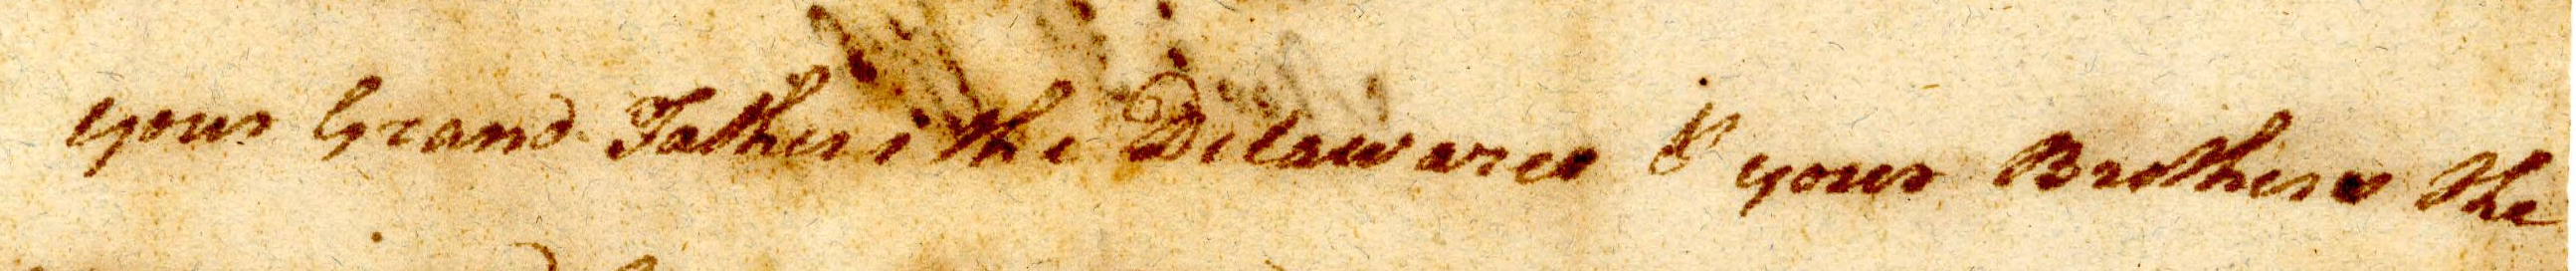your Grand Fathers The Delawares & your Brothers the
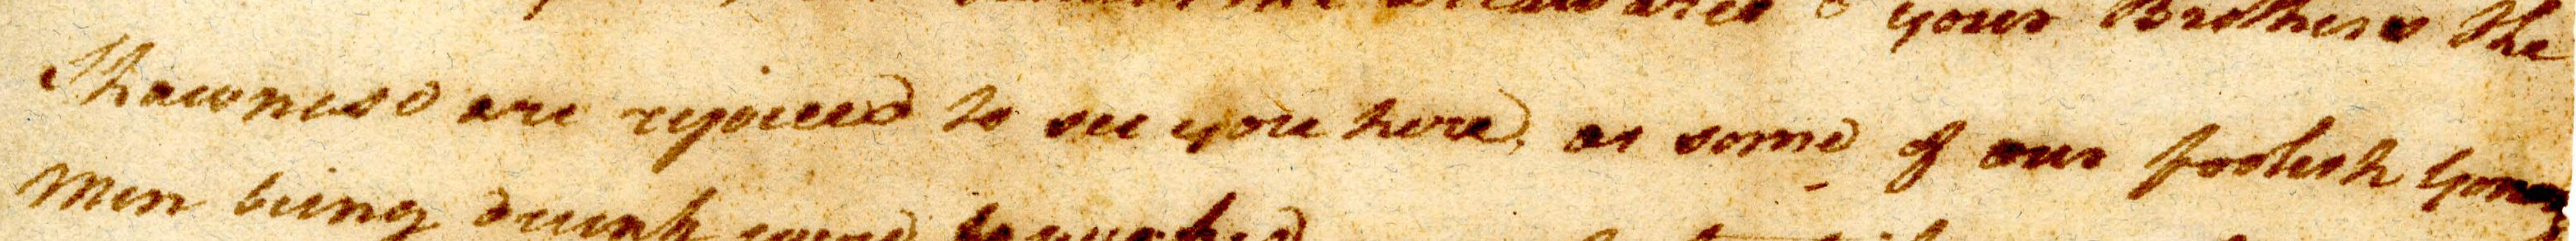Shawnese are rejoiced to see you here as some of our foolish young
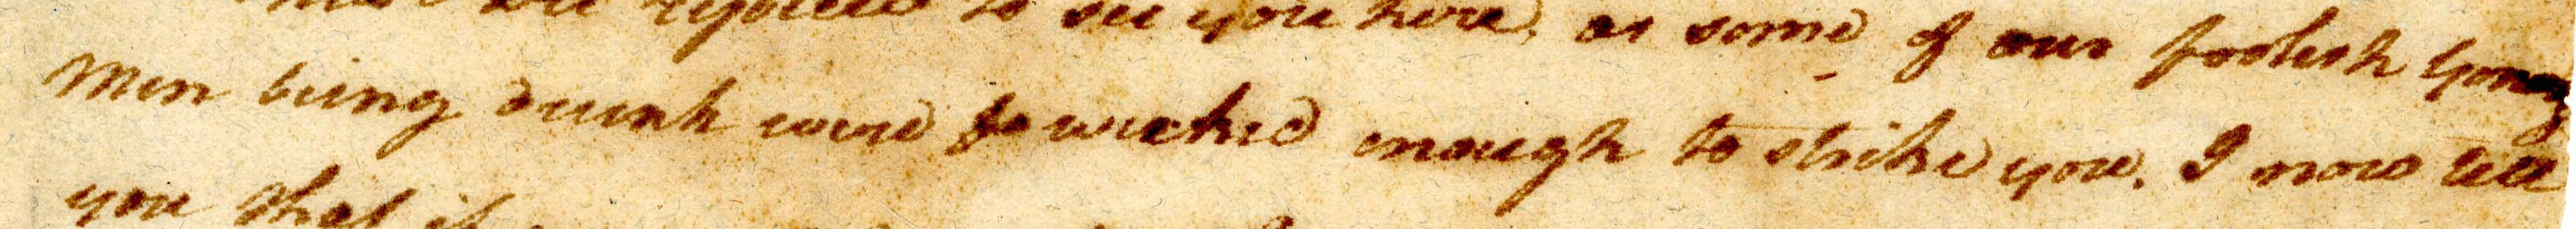Men being drunk were so wicked enough to strike you. I now tell
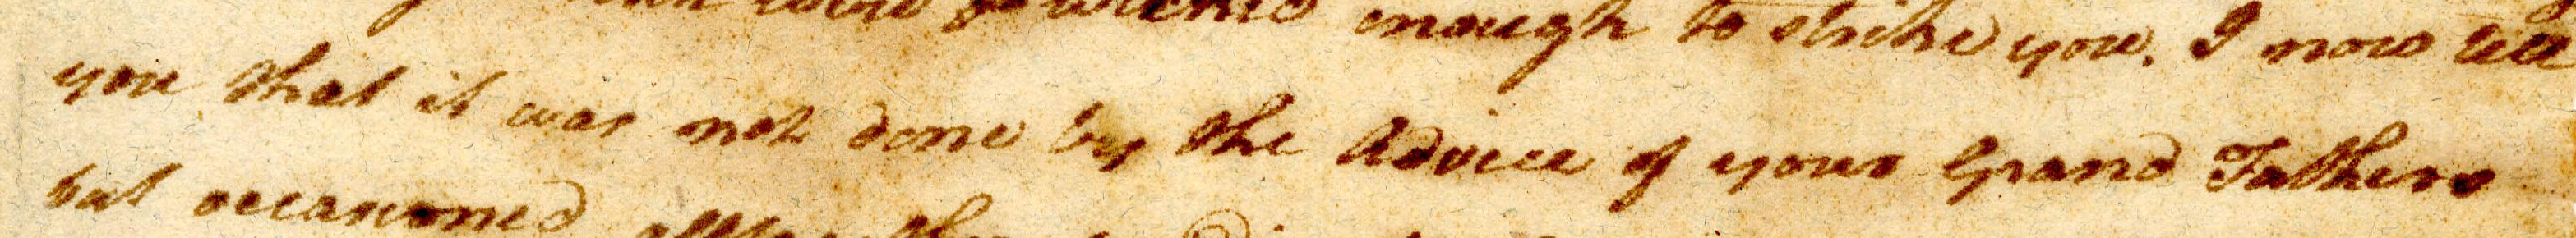you that it was not done by the Advice of your Grand Fathers
